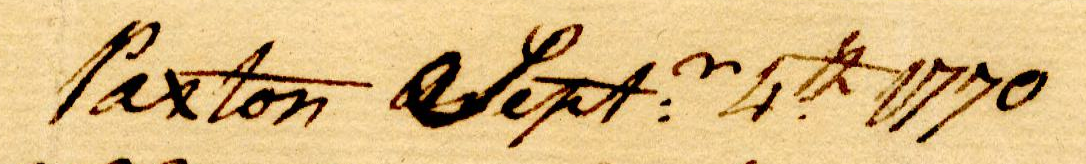Paxton Sept^r: 4^th. 1770
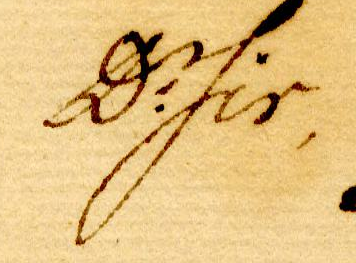D^r. Sir,
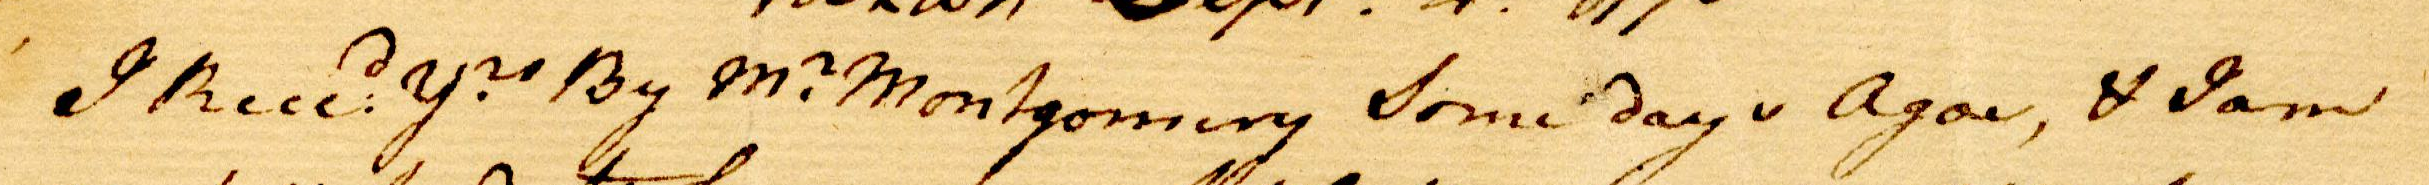I Rece^d: y^rs. By M^r. Montgomery Some days Agoe, & I am
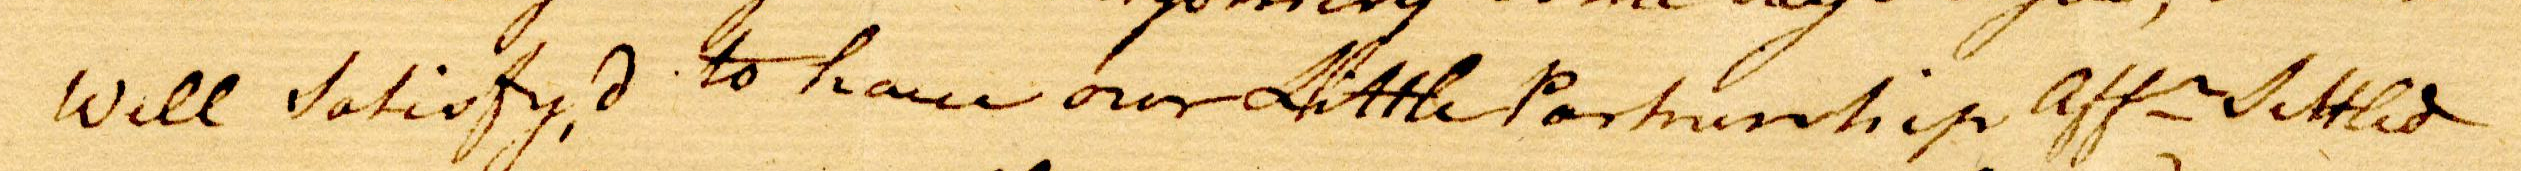well satisfy,d to have our Little Partnership aff^r Settled
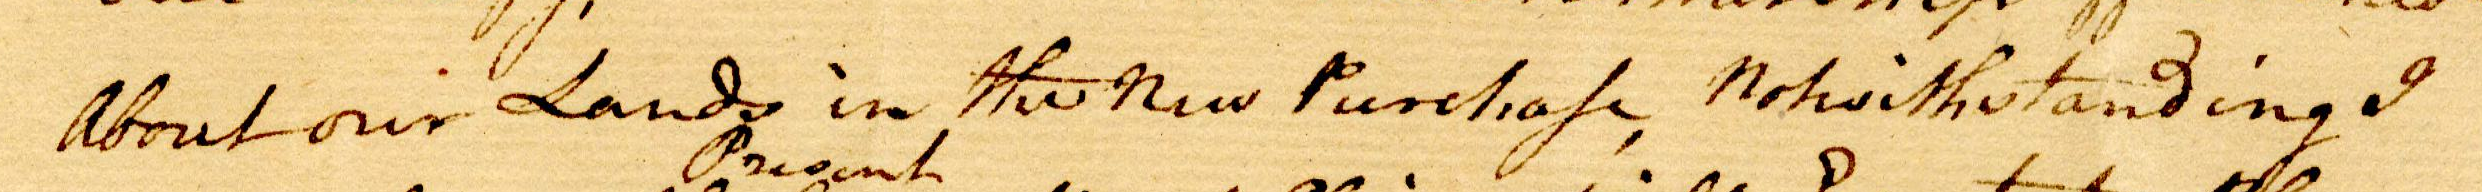About our Lands in the new Purchase, notwithstanding I
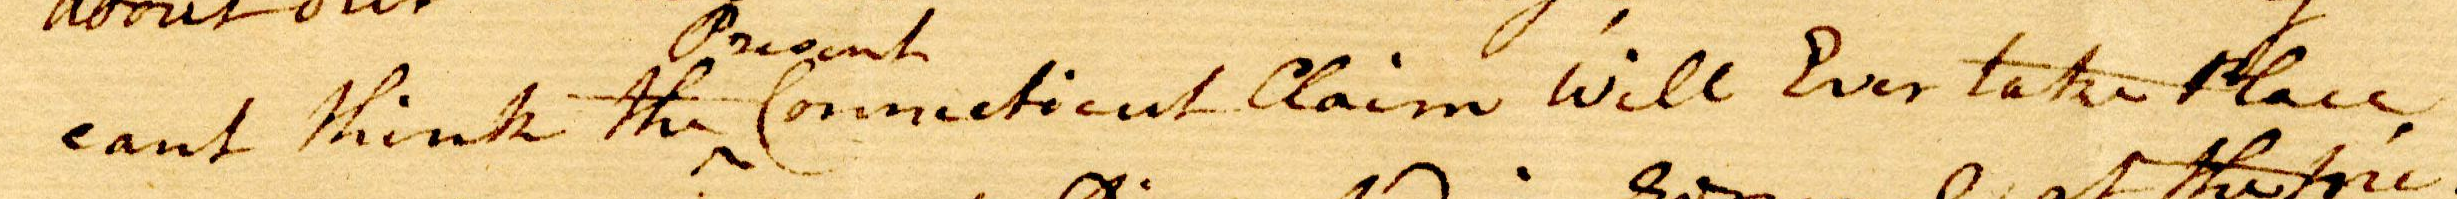cant think the ^ Connecticut Claim will Ever take Place,
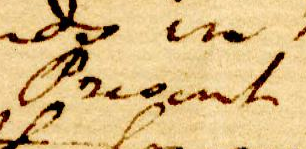Present
